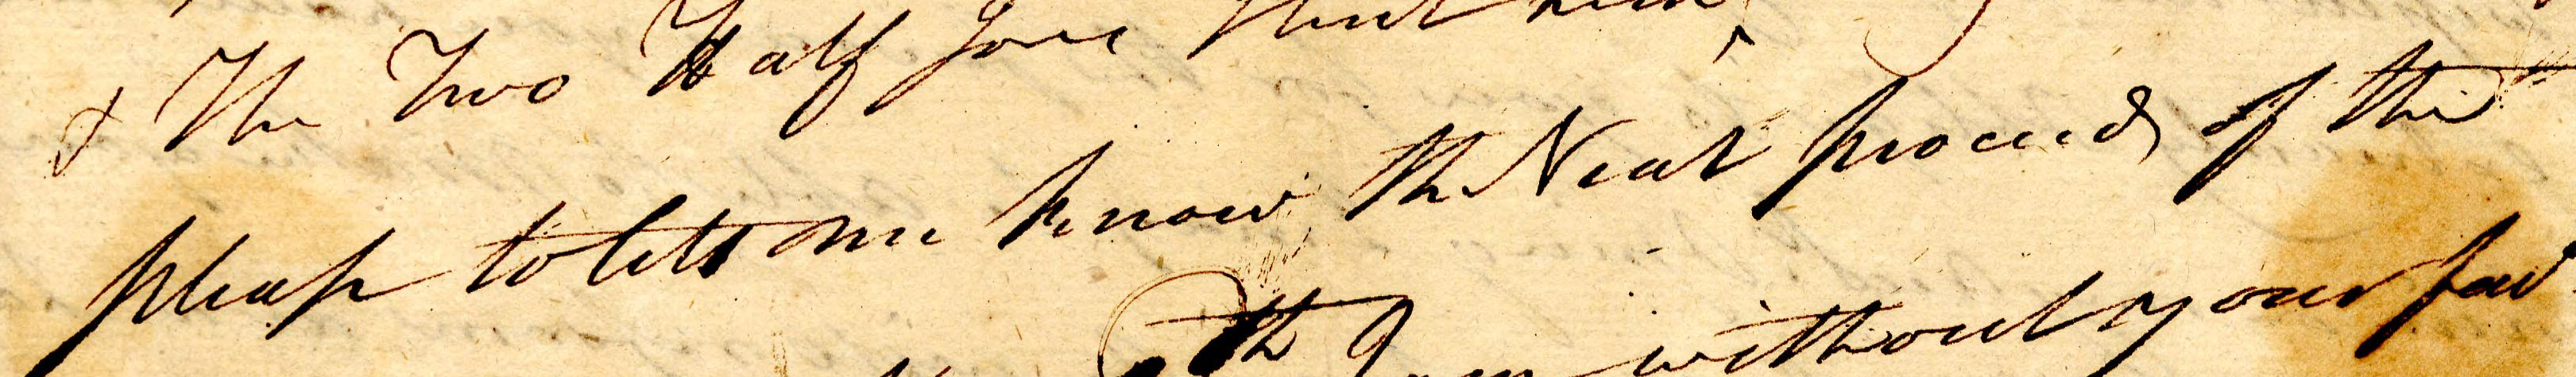please to let me know, the Next proceeds of the
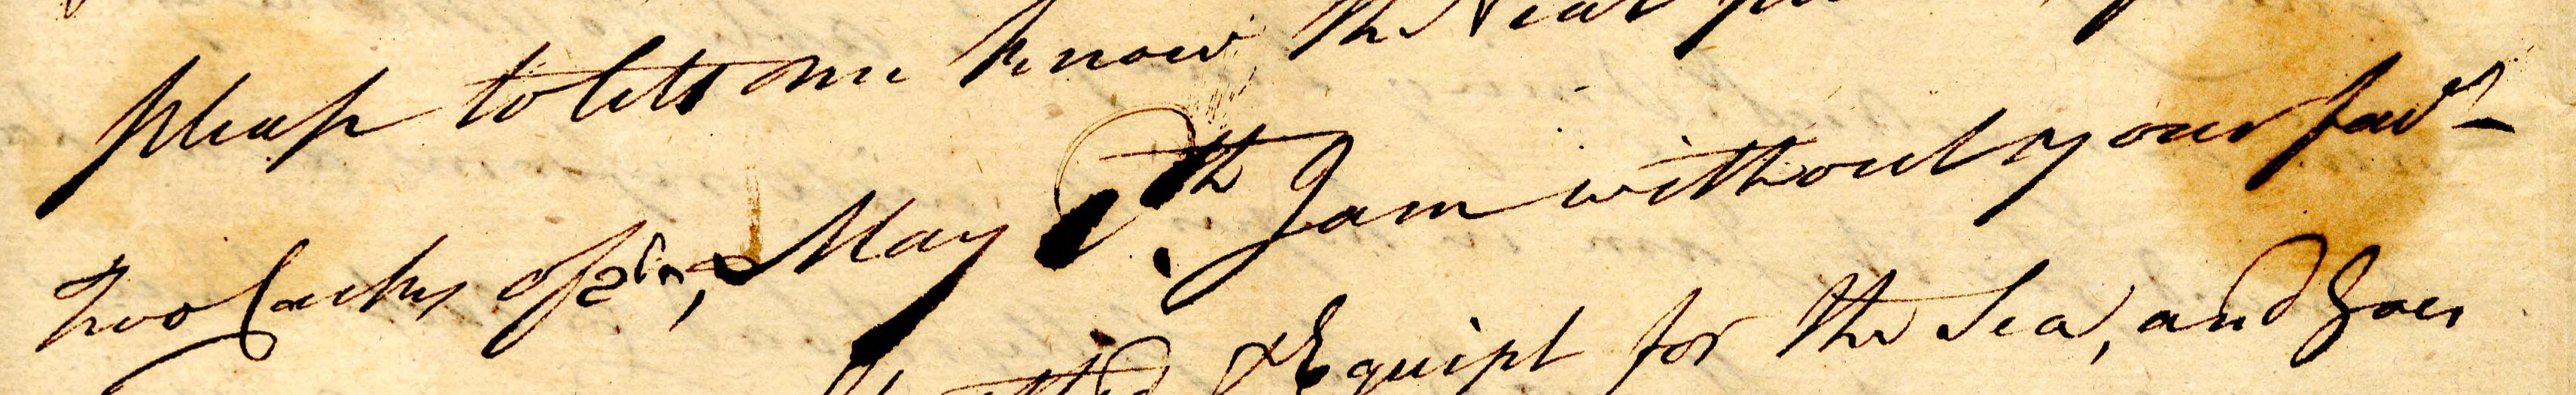Two Casks of ale, May 8^th I am without your fav^r
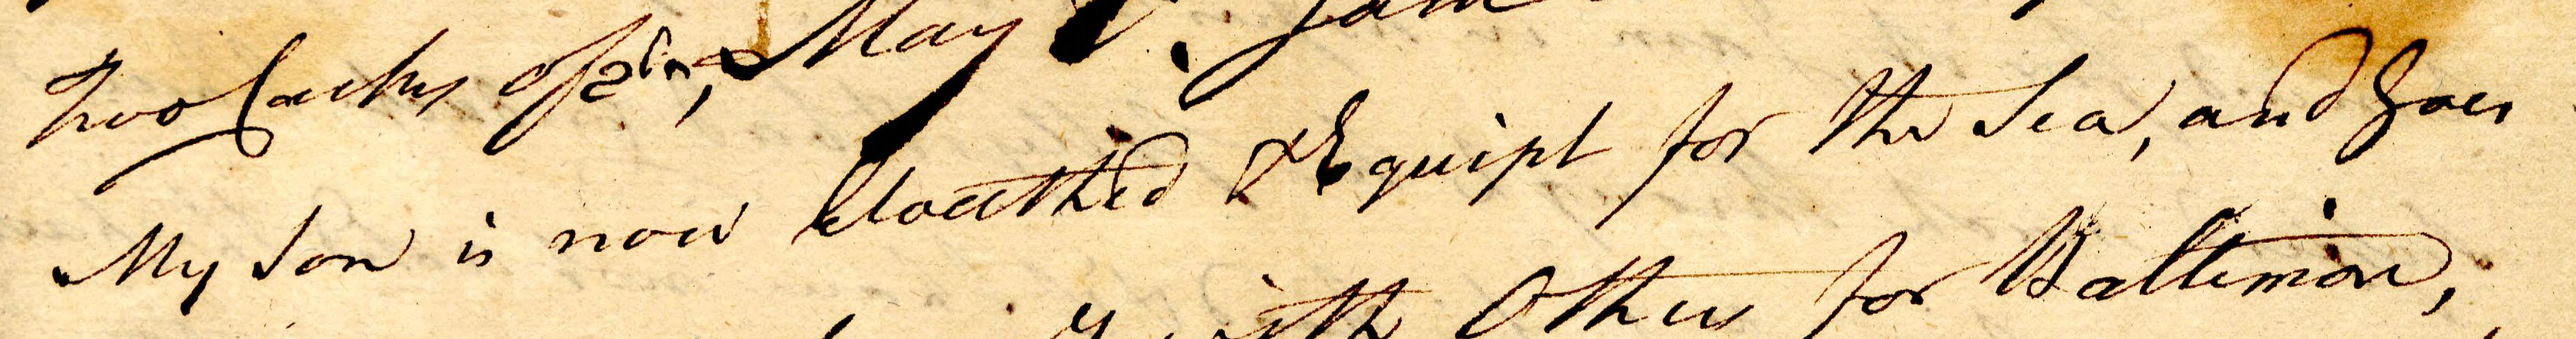My son is now Cloathed & Equipt for the sea, and goes
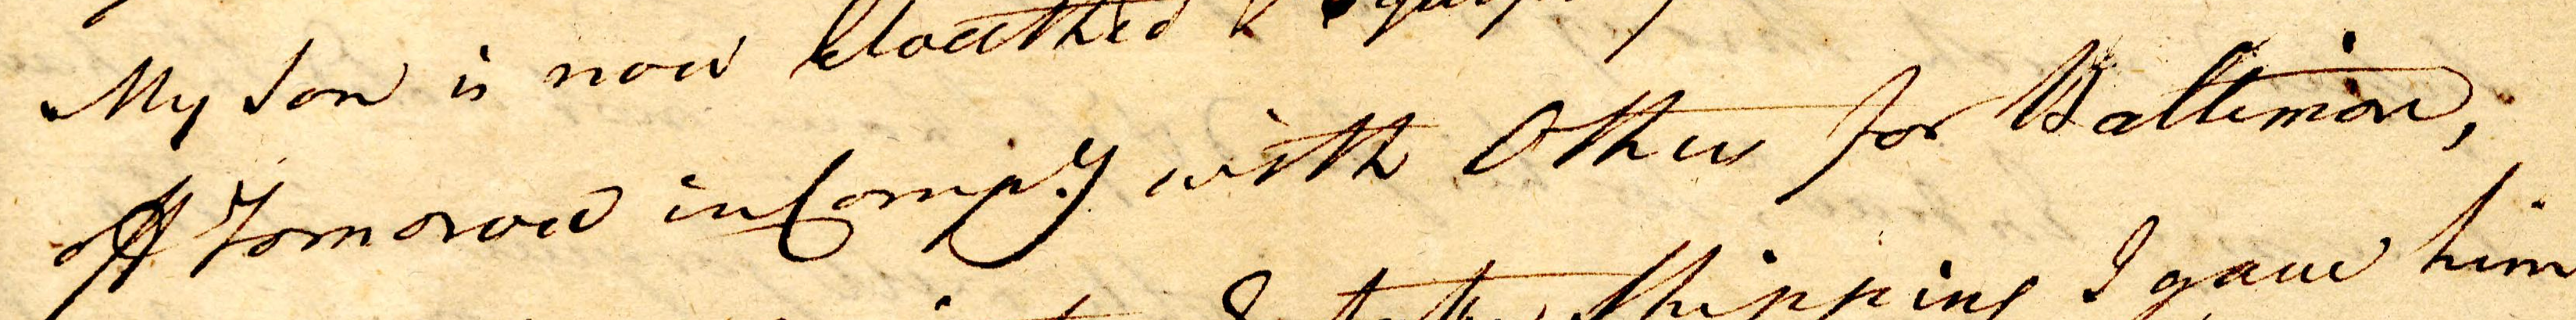off tomorow in Comp^y. with Others for Baltimore;
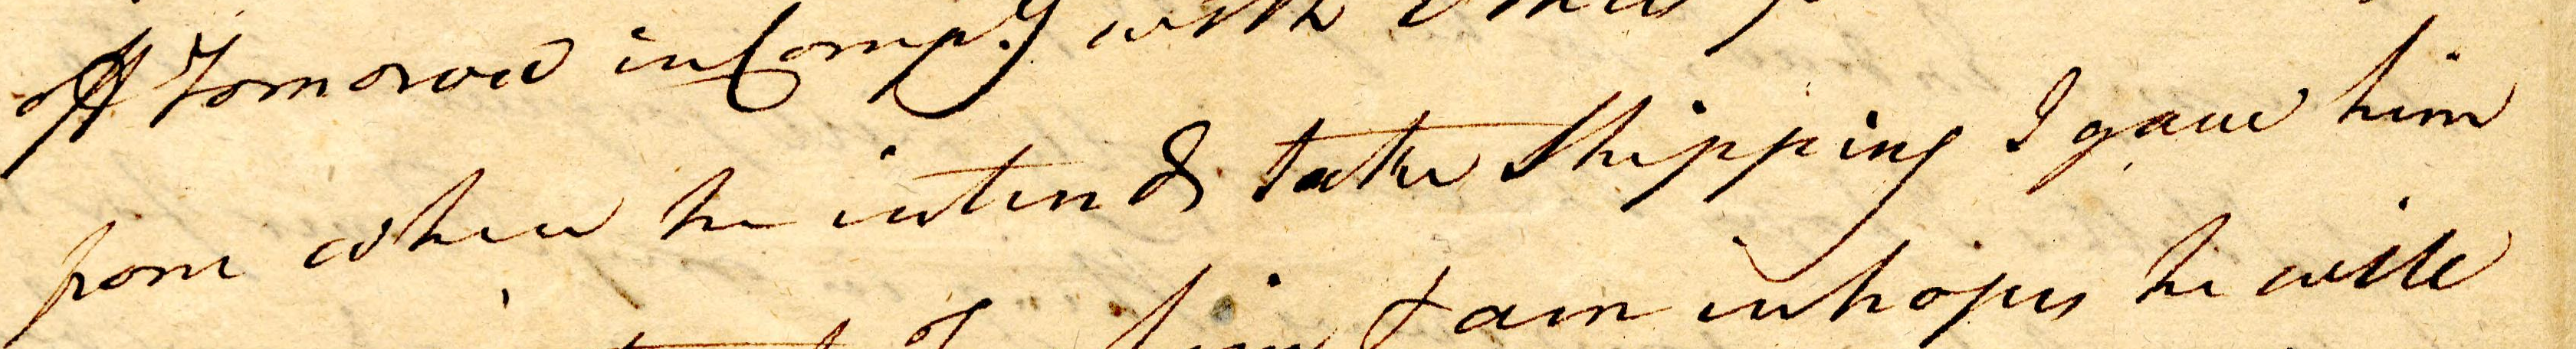from where he intend take shipping I gave him
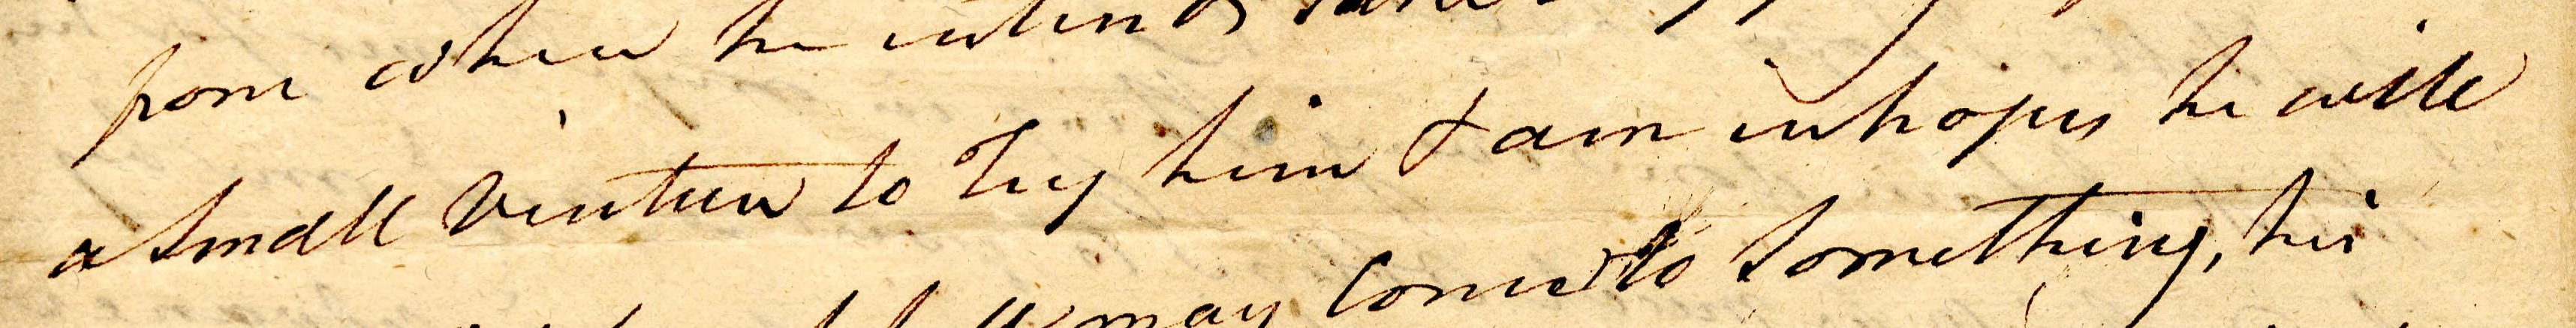a Small venture to Try him & am in hopes he will
